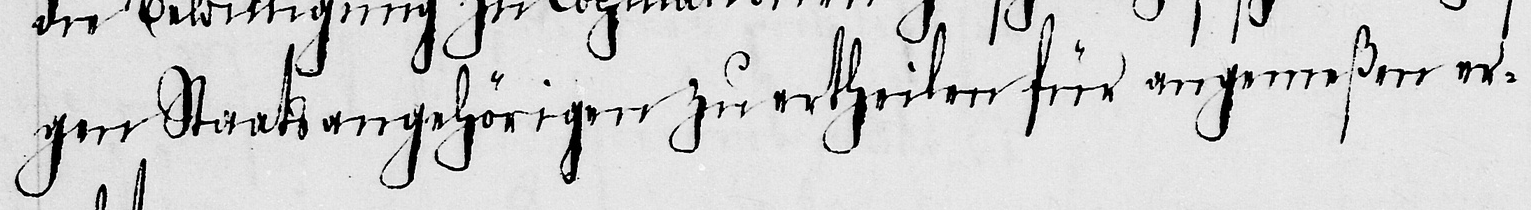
igen Staatsangehörigen zu ertheilen angemeßen er¬
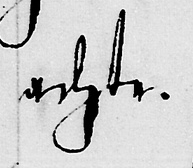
achte.
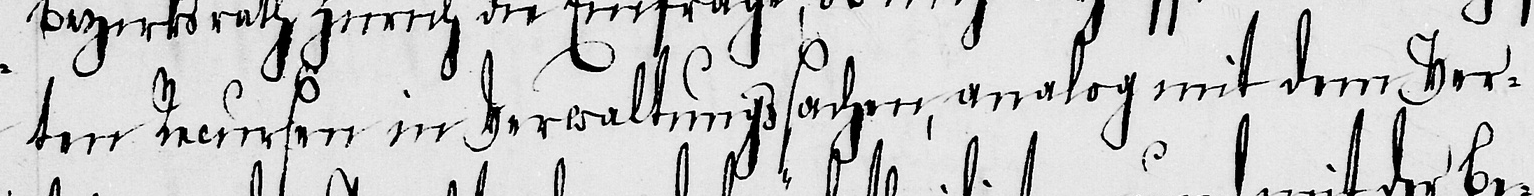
ften Recursen in Verwaltungssachen, analog mit dem Ver¬
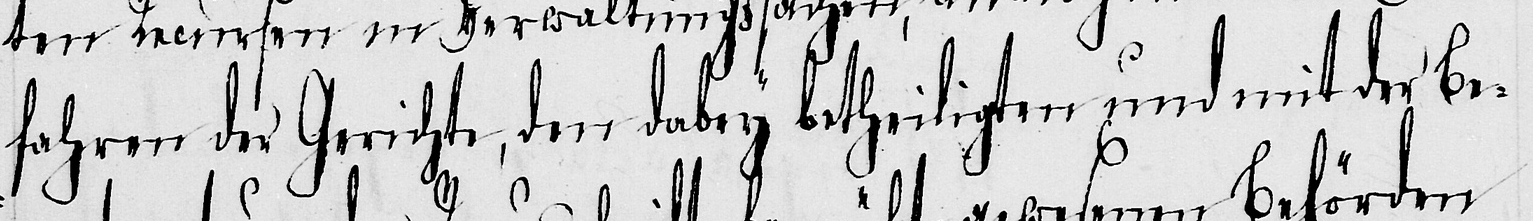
fahren der Gerichte, den dabey betheiligten und mit der Be¬
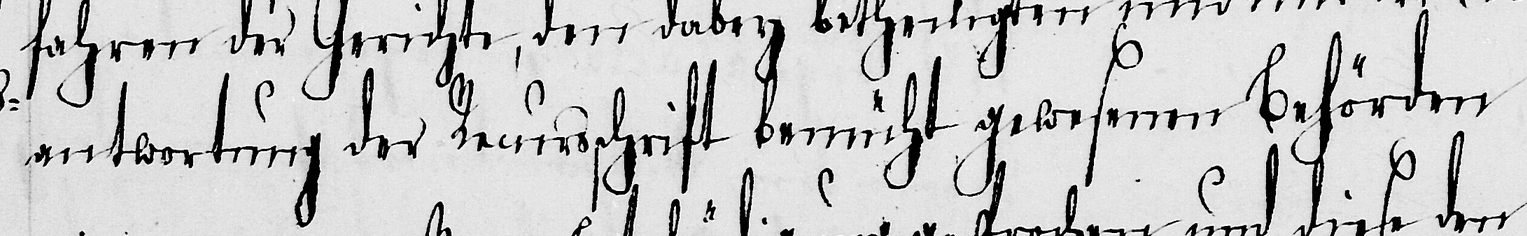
antwortung der Recursschrift bemüht gewesenen Behörden
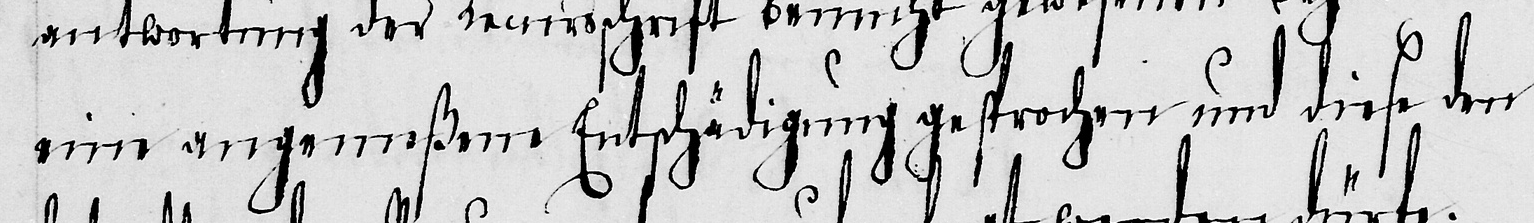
eine angemeßene Entschädigung gesprochen und diese den
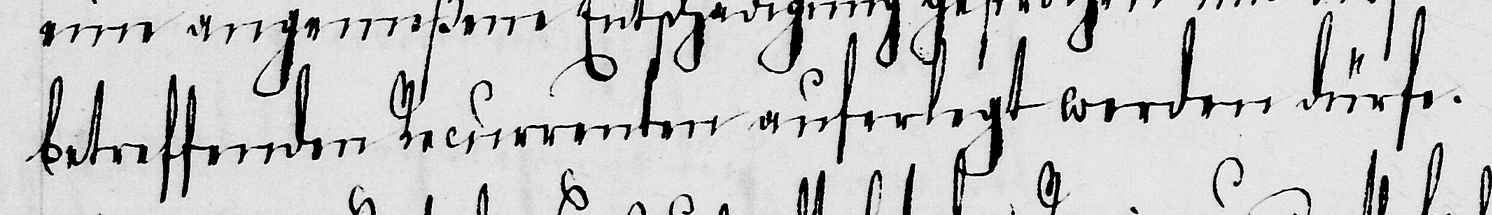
betreffenden Recurrenten auferlegt werden dürfe.
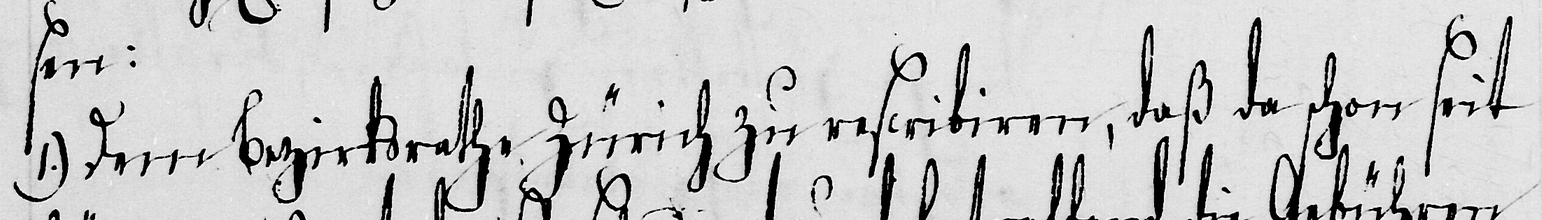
1.) Dem Bezirksrathe Zürich zu rescribiren, daß da schon seit
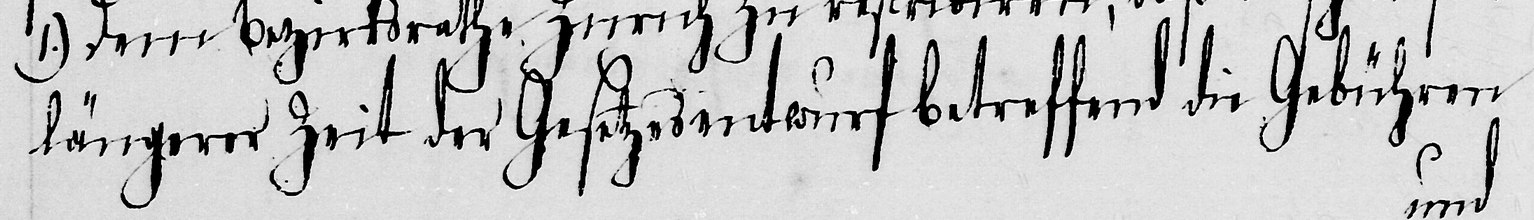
längerer Zeit der Gesetzesentwurf betreffend die Gebühren
